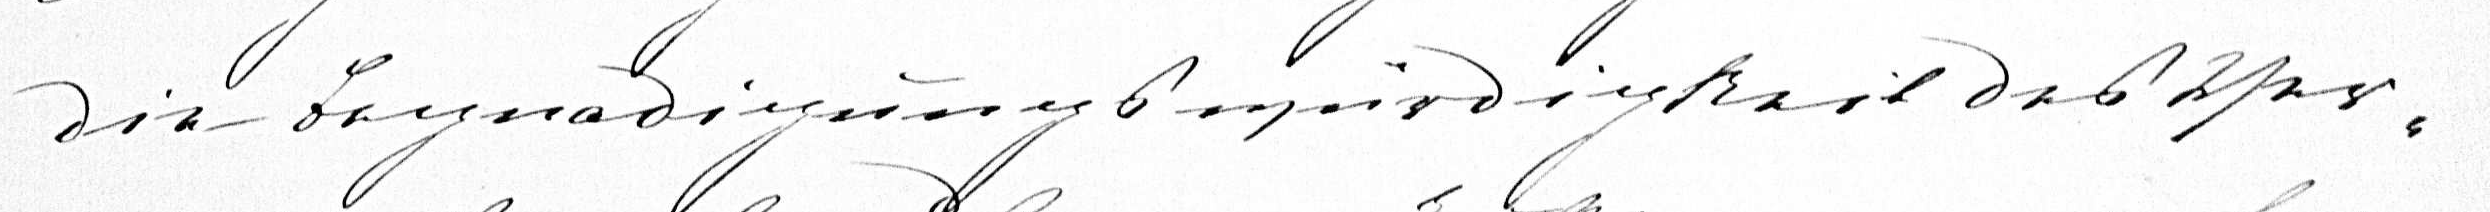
die Begnadigungswürdigkeit des Ver¬
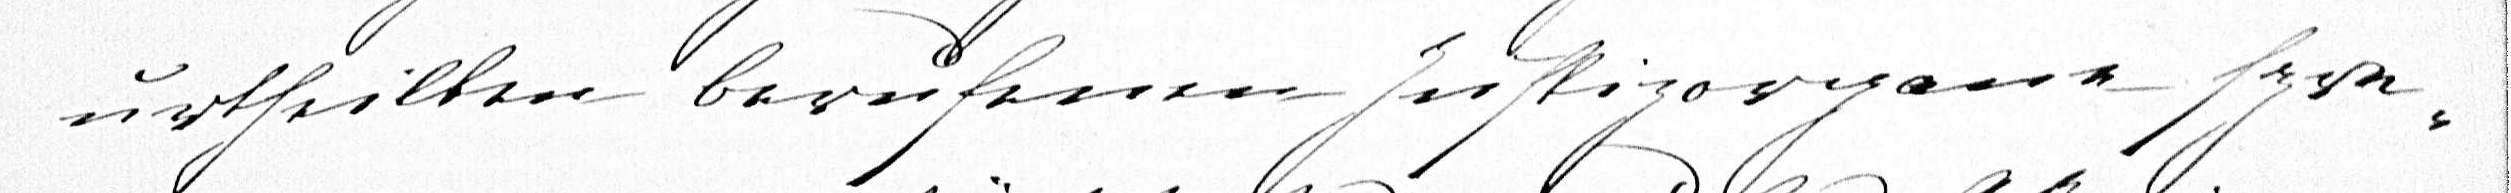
urtheilten berufenen Justizorgane spre¬
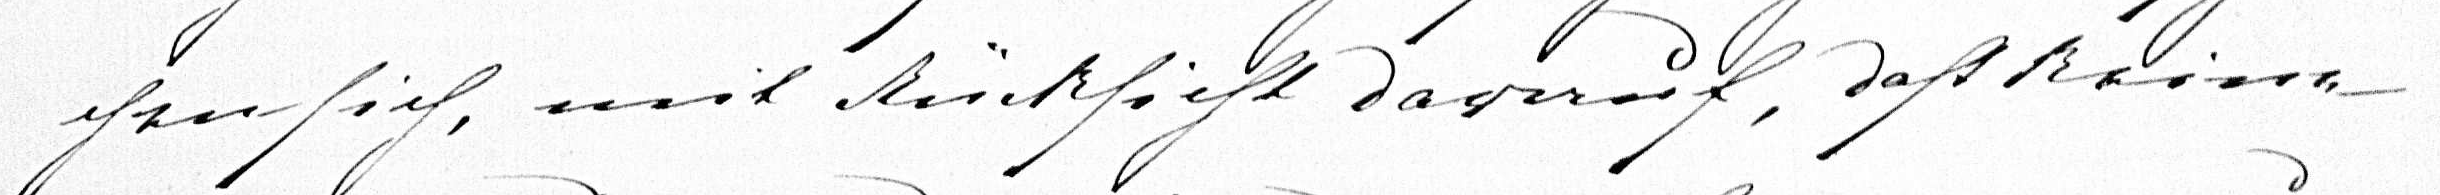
chen sich, mit Rücksicht darauf, daß keine
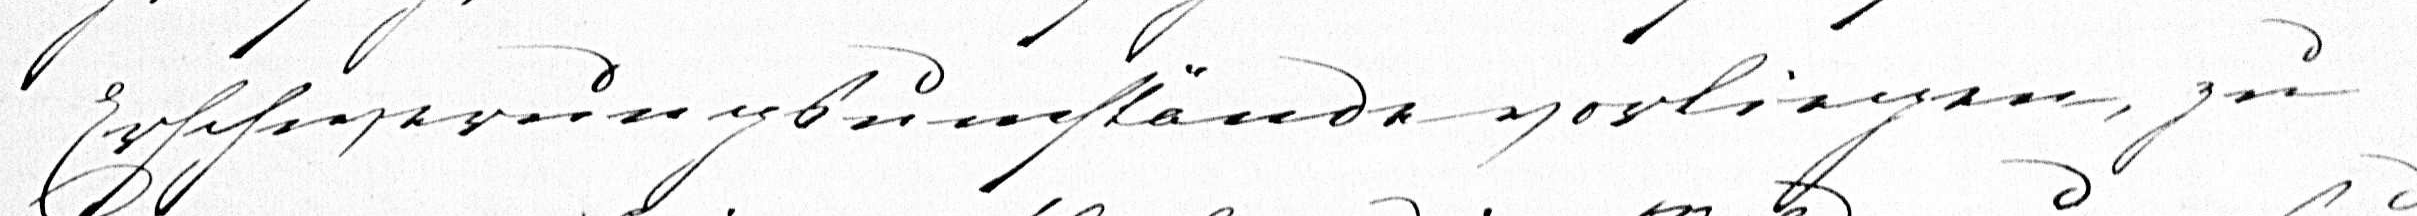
Erschwerungsumstände vorliegen, zu
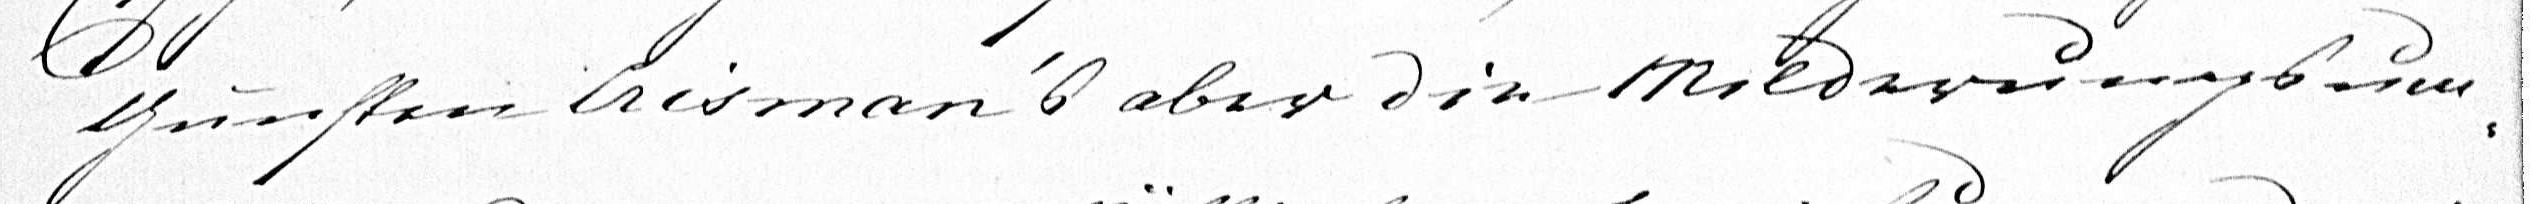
Gunsten Crisman's aber die Milderungsum¬
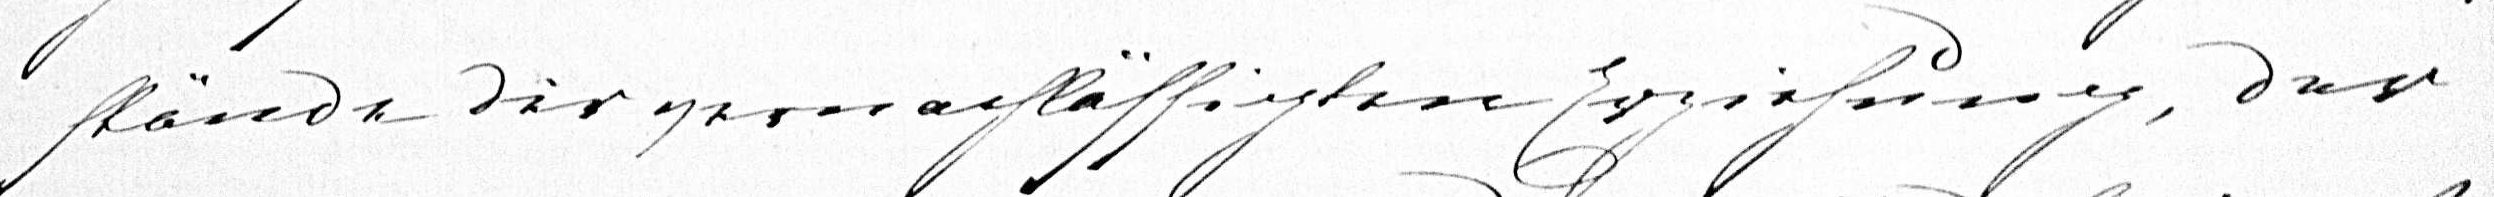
stände die vernachlässigten Erziehung, der
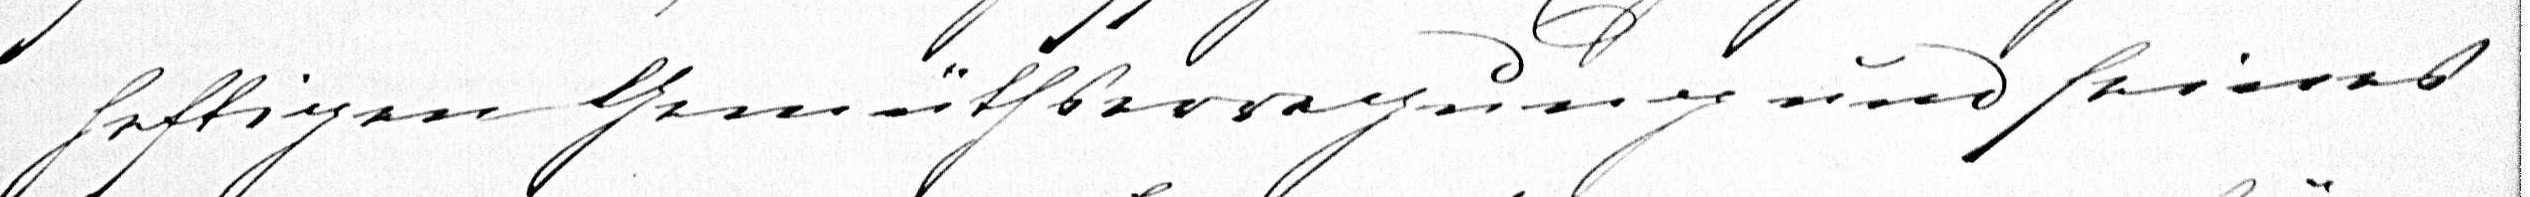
heftigen Gemüthserregung und seines
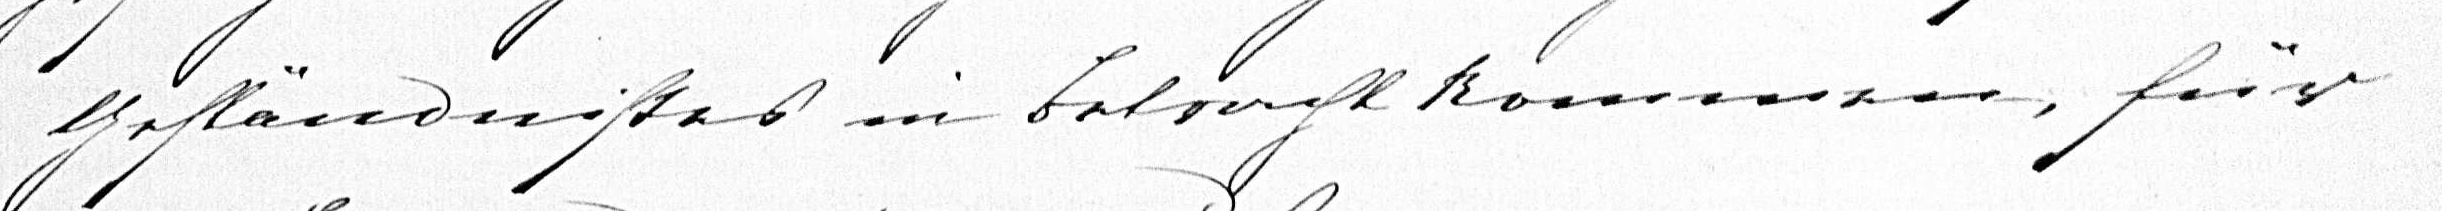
Geständißes in Betracht kommen, für
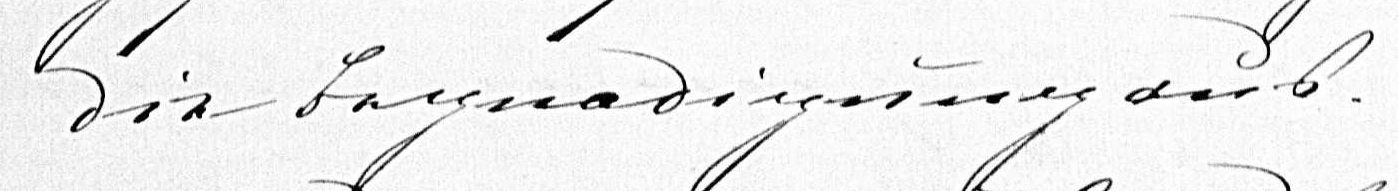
die Begnadigung aus.
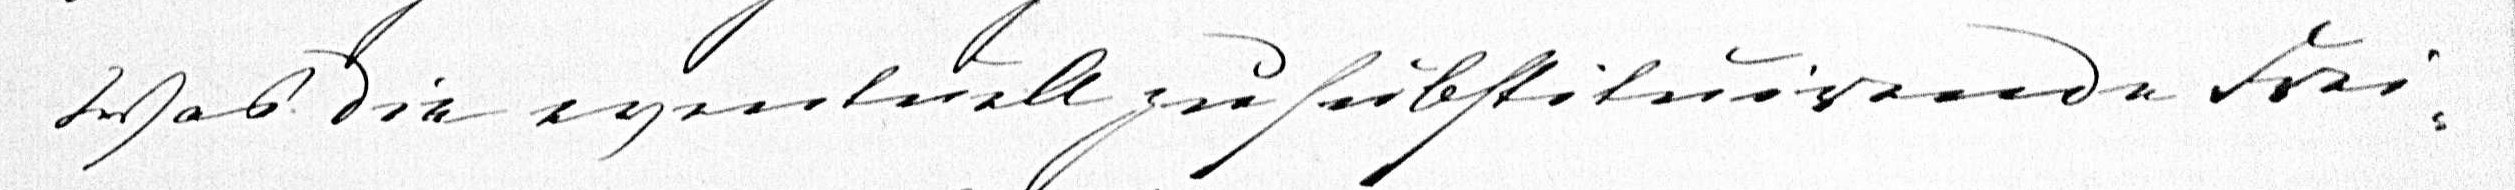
Was die eventuell zu substituirende Frei¬
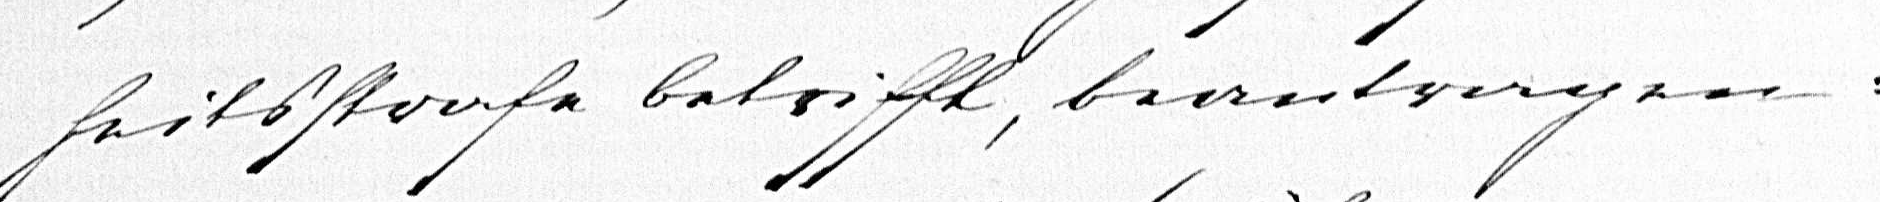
heitsstrafe betrifft, beantragen:
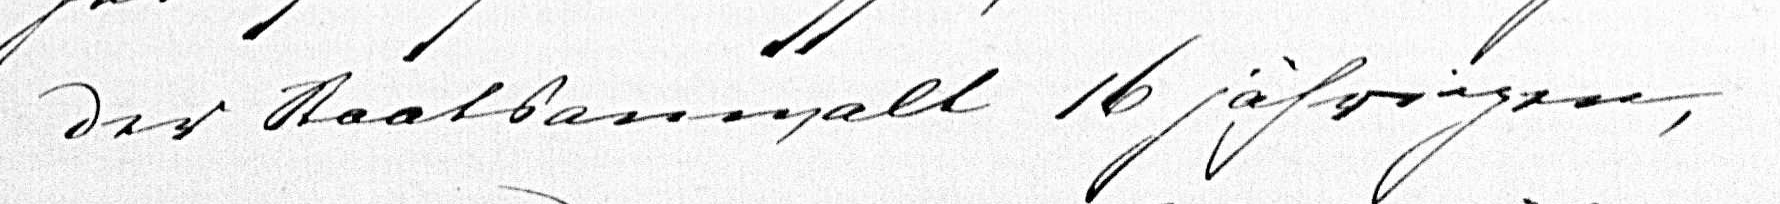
der Staatsanwalt 16 jährigen,
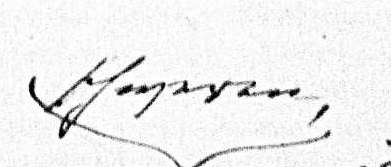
schweren,
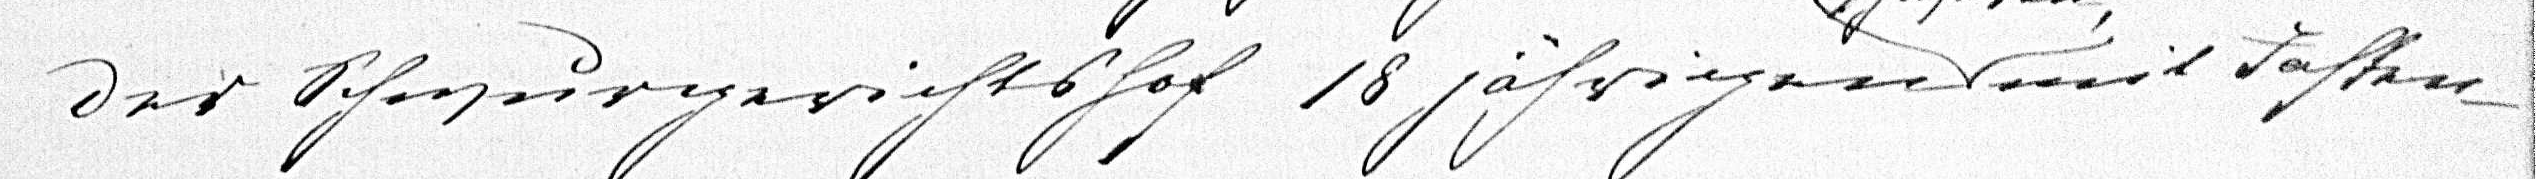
der Schwurgerichtshof 18 jährige mit Fasten
